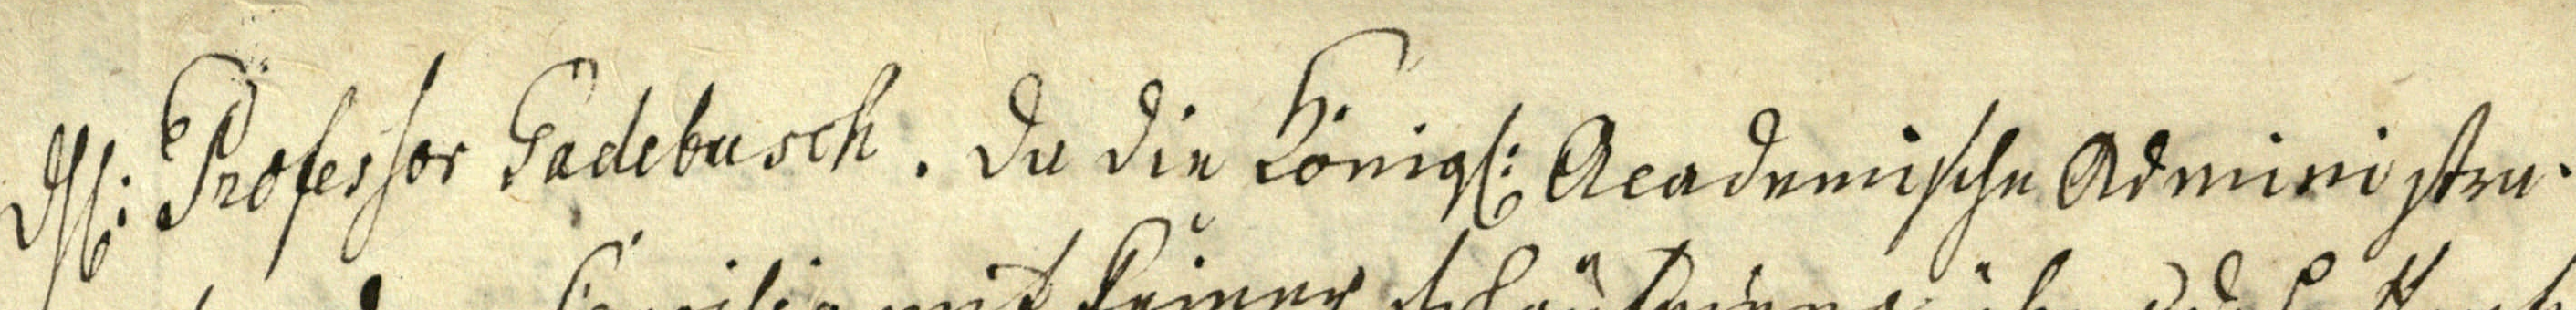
dh. Professor Gadebusch. Da die Königl Academische Administra¬
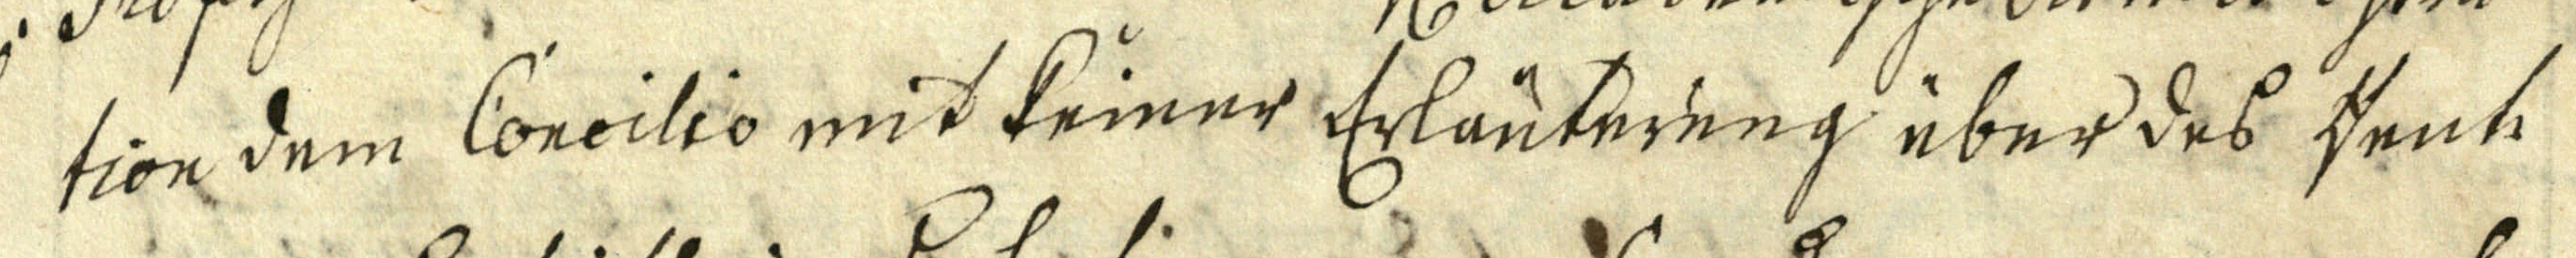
tion dem Concilio mit keiner Erläuterung über des Rent¬
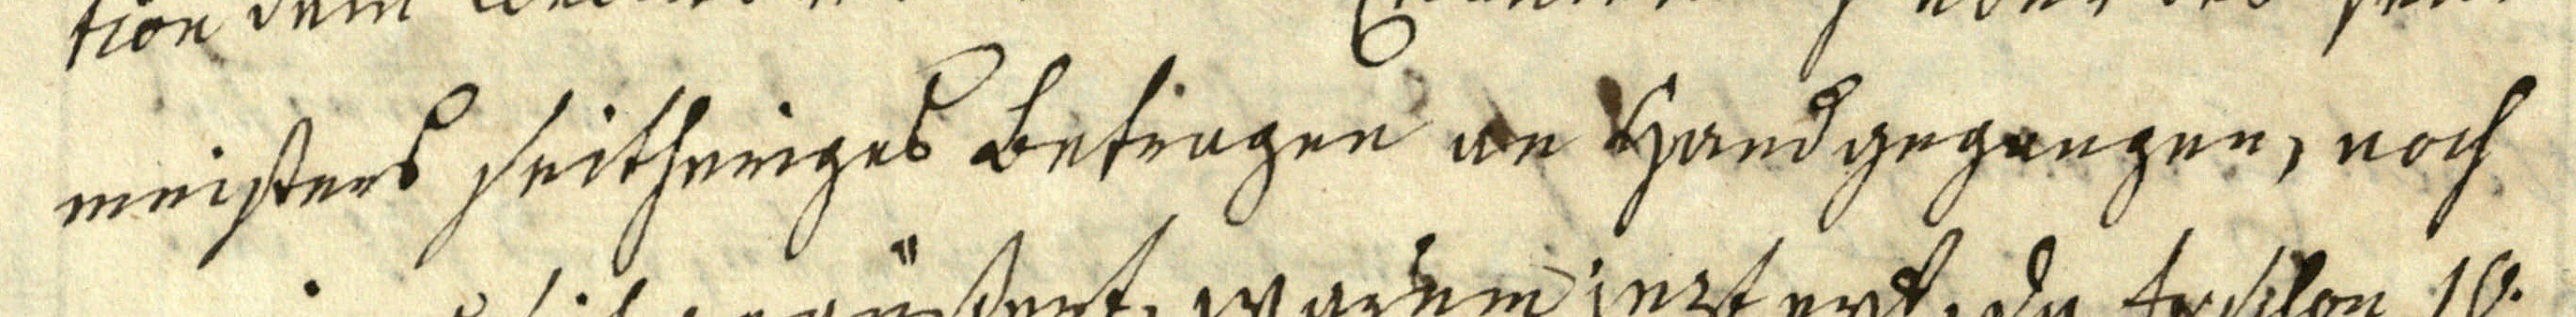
meisters seitheriges Betragen an Hand gegangen, noch
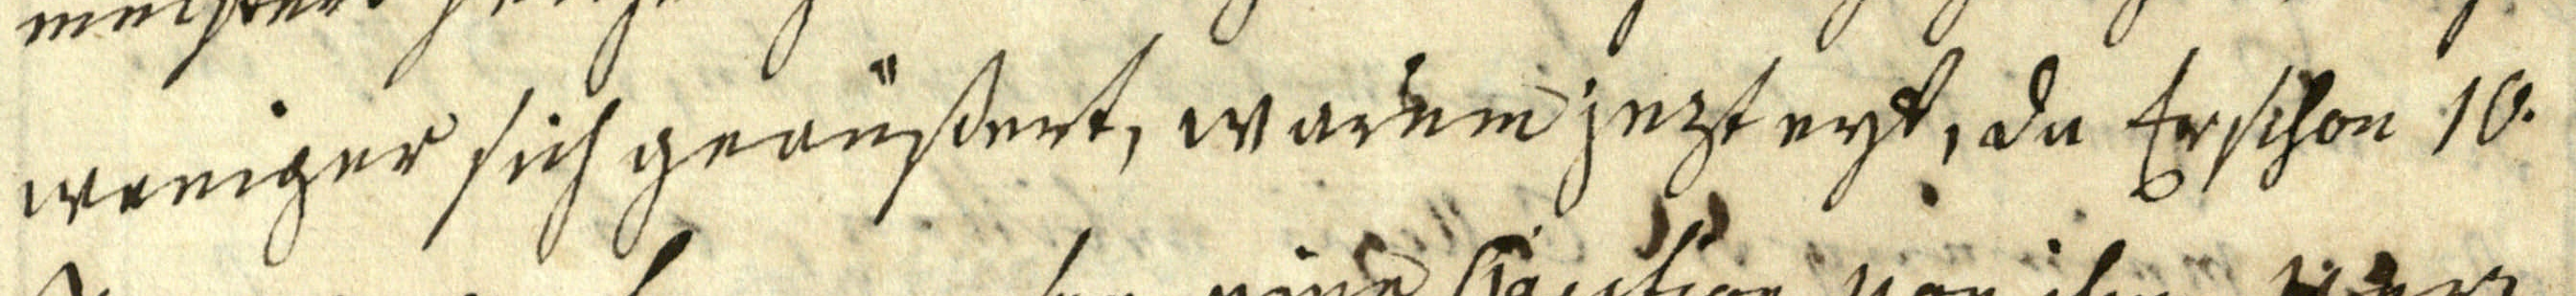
weniger sich geäußert, warum jezt erst, da Er schon 10.
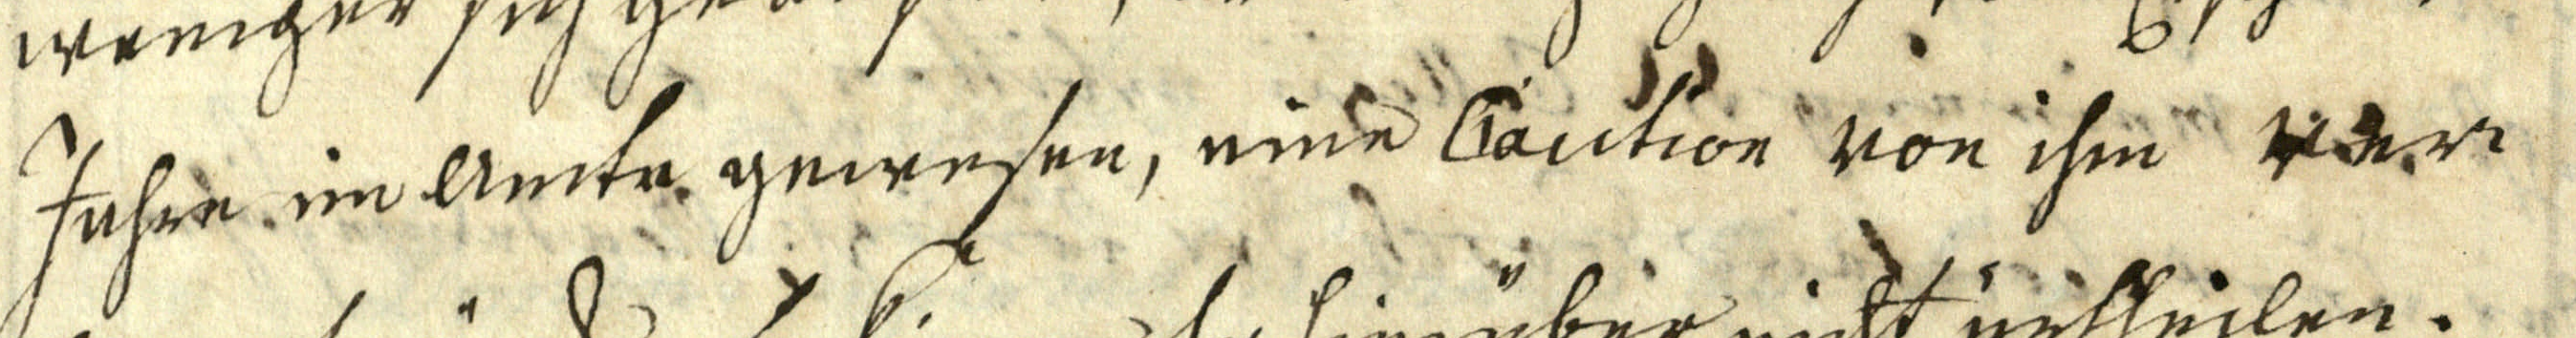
Jahre in Amte gewesen, eine Caution von ihm ver¬
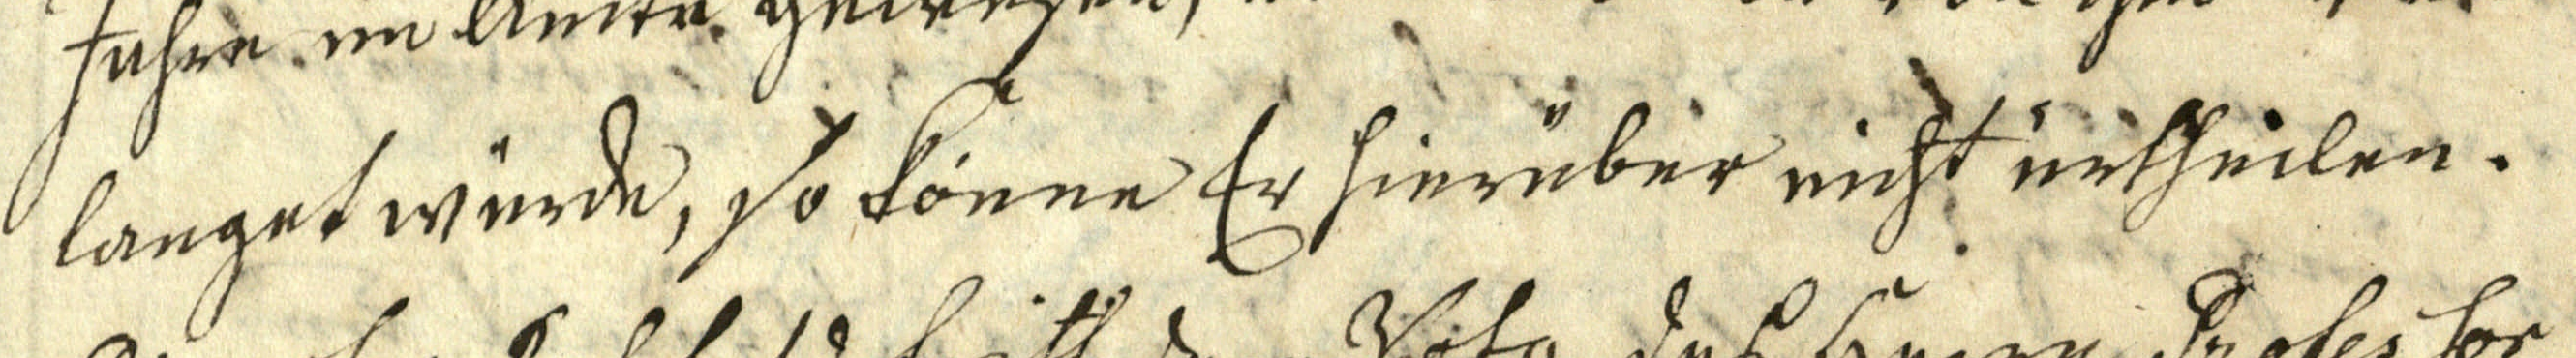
langet würde, so könne Er hierüber nicht urtheilen.
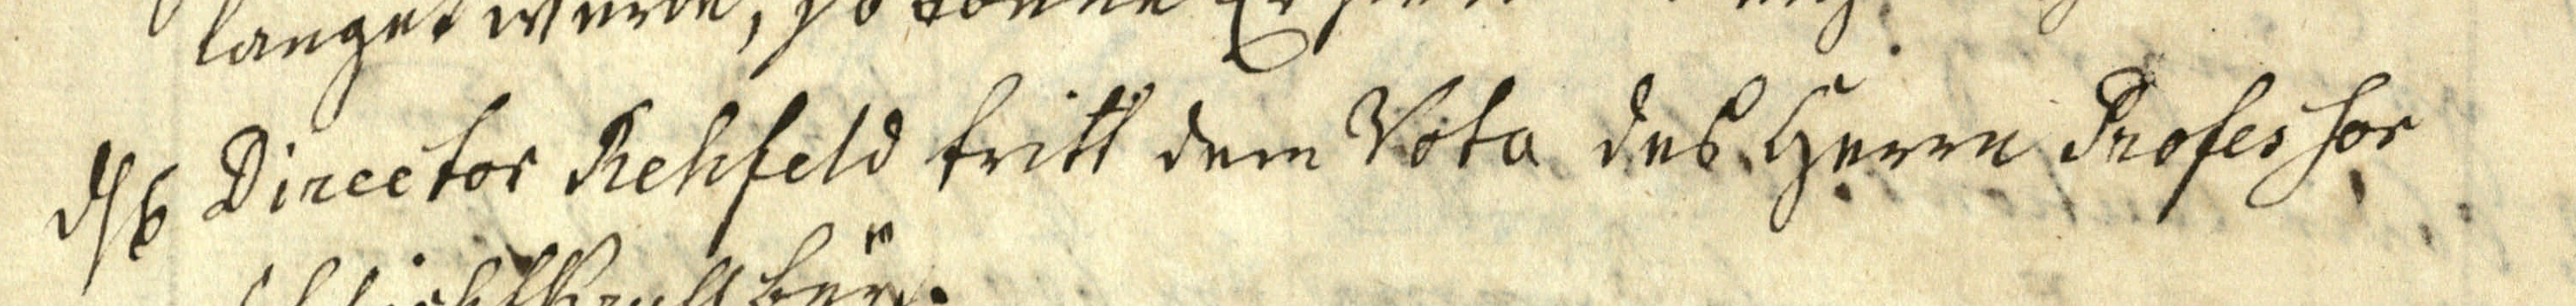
dh Director Rehfeld tritt dem Vota das Herrn Professor
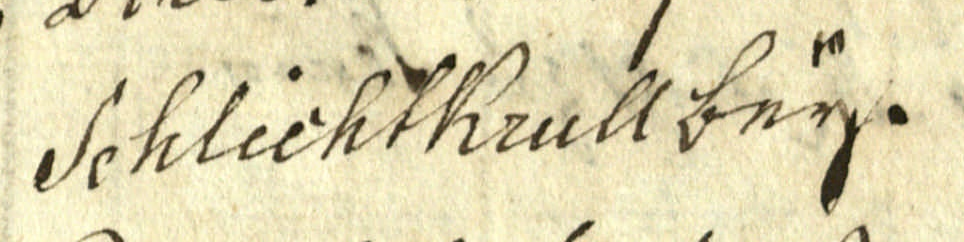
Schlichtkrull beÿ.
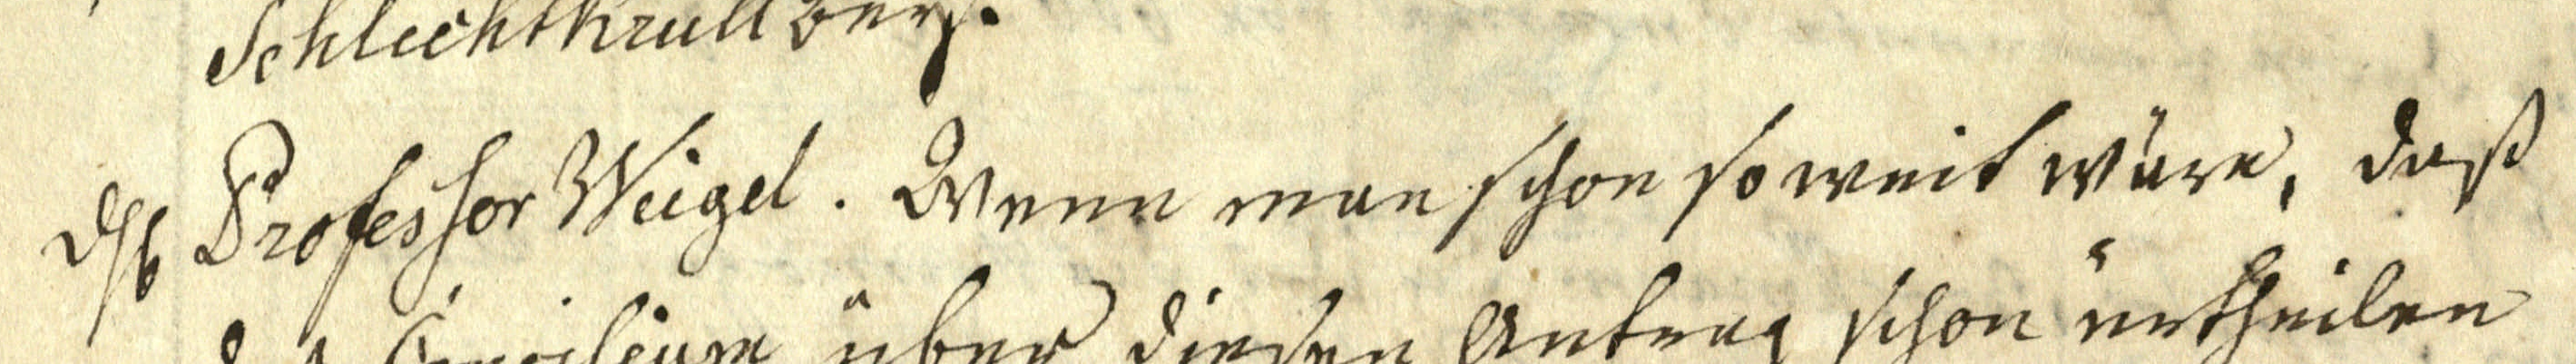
dh Professor Weigel. Wenn man schon so weit wäre, daß
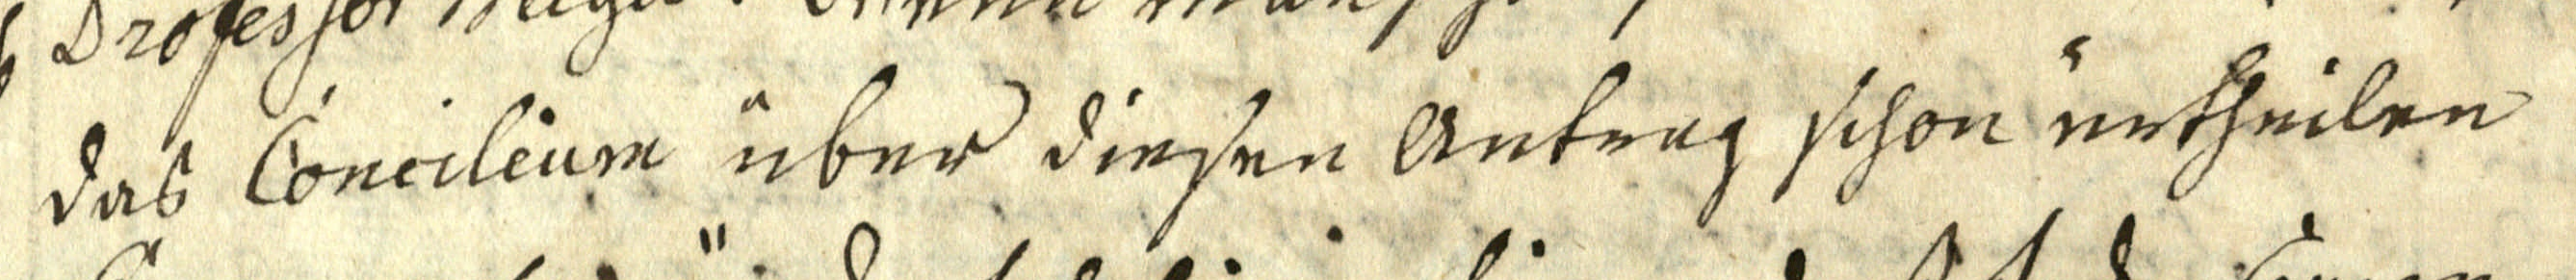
das Concilium über diesen Antrag schon u
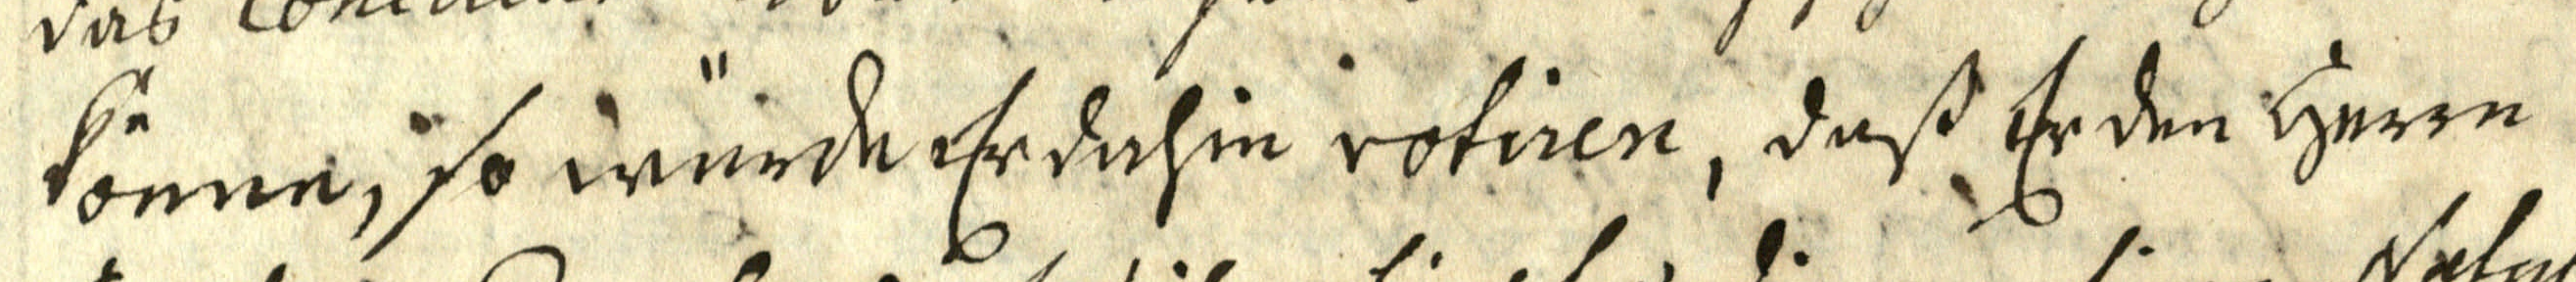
könne, so würde Er dahin votiren, daß Er den Herrn
